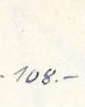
108
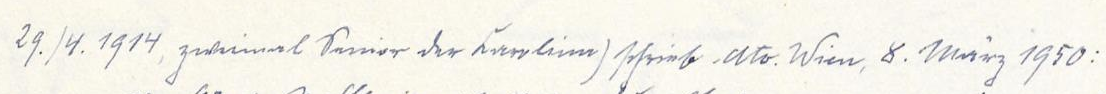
29. /4. 1914, zweimal Senior der Carolina) schrieb dto. Wien, 8. März 1950:
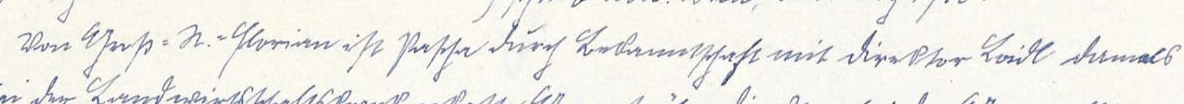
Von Groß.- St. - Florian ist Pascha durch Bekanntschaft mit Direktor Loidl damals
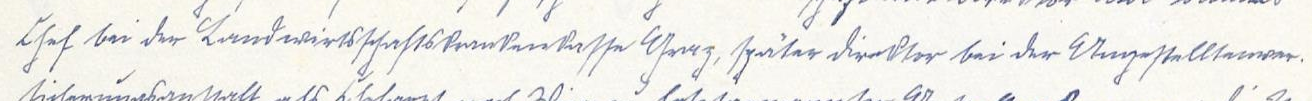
Chef bei der Landwirkschaftskrankenkasse Graz, später Direktor bei der Angestelltenver.
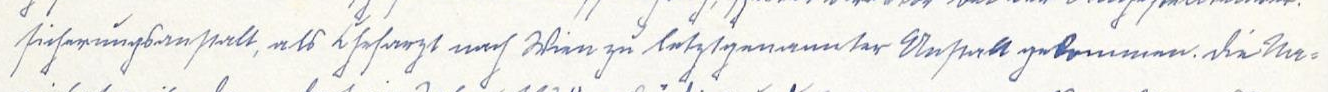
sicherungsanstalt, als Chefarzt nach Wien zu letztgenannter Anstalt gekommen. Die Na-
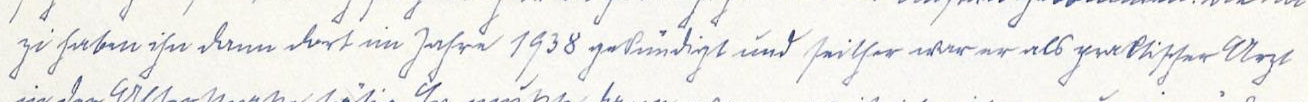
zi haben ihn dann dort im Jahre 1938 gekündigt und seither war er als praktischer Arzt
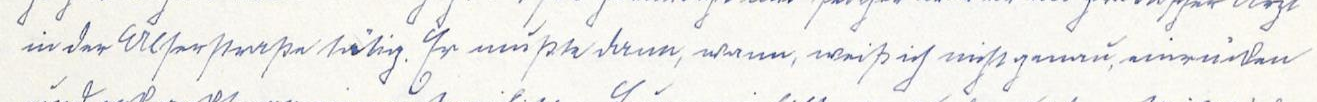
in der Alserstraße tätig. Er mußte dann, wann, weiß ich nicht genau, einrücken
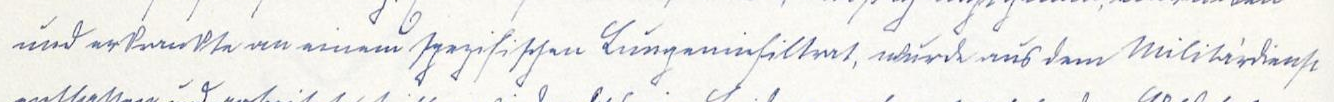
und erkrankte an einem spezifischen Lungeninfiltrat, wurde aus dem Militärdienst
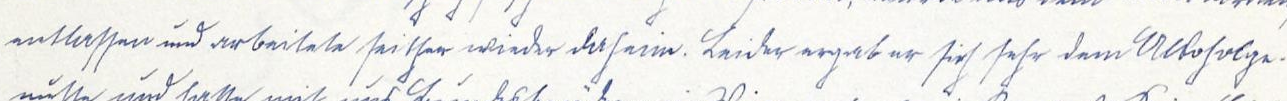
entlassen und arbeitete seither wieder daheim. Leider ergab er sich sehr dem Alkoholge-
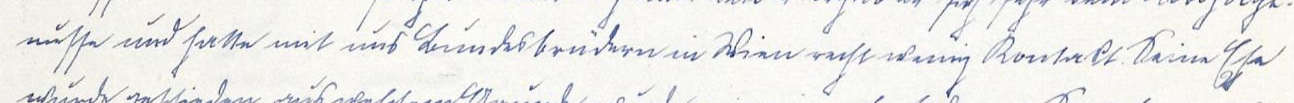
nusse und hatte mit uns Bundesbrüdern in Wien recht wenig Kontakt. Seine Ehe
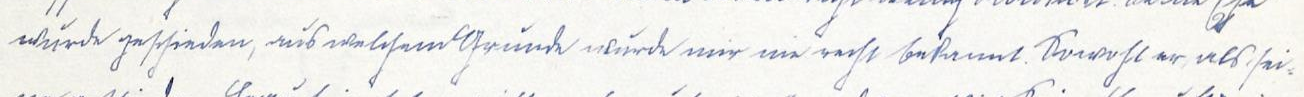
wurde geschieden, aus welchem Grund wurde mir nie recht bekannt. Sowohl er als sei-
